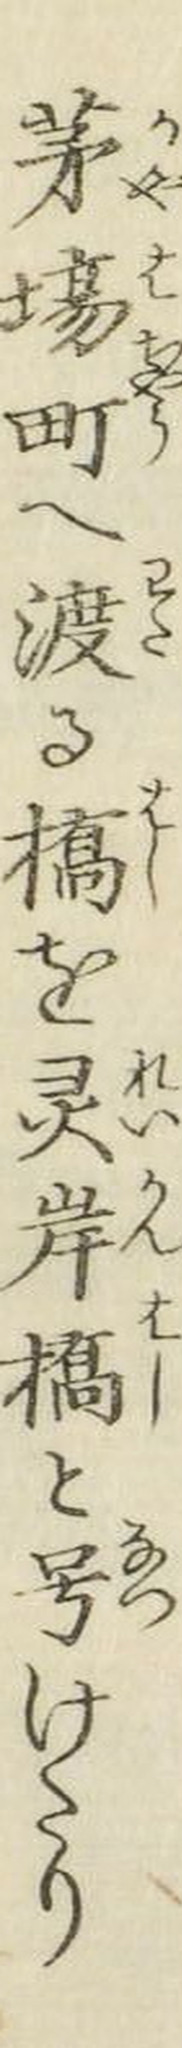茅場町へ渡る橋を霊岸橋と号けたり
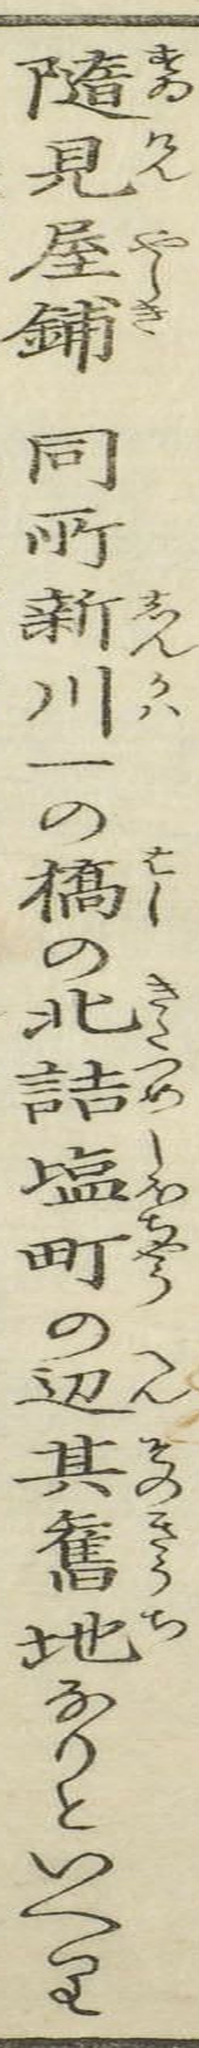随見屋鋪同所新川一の橋の北詰塩町の辺其舊地なりといへり
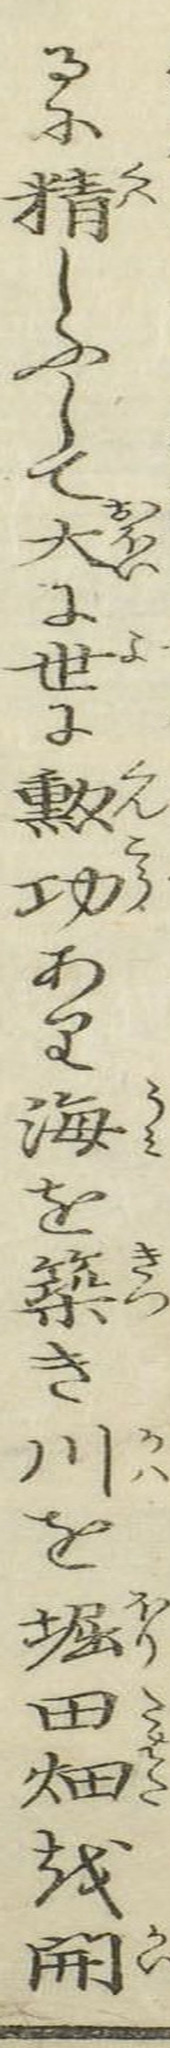るに精しふして大に世に勲功あり海を築き川を堀田畑を開
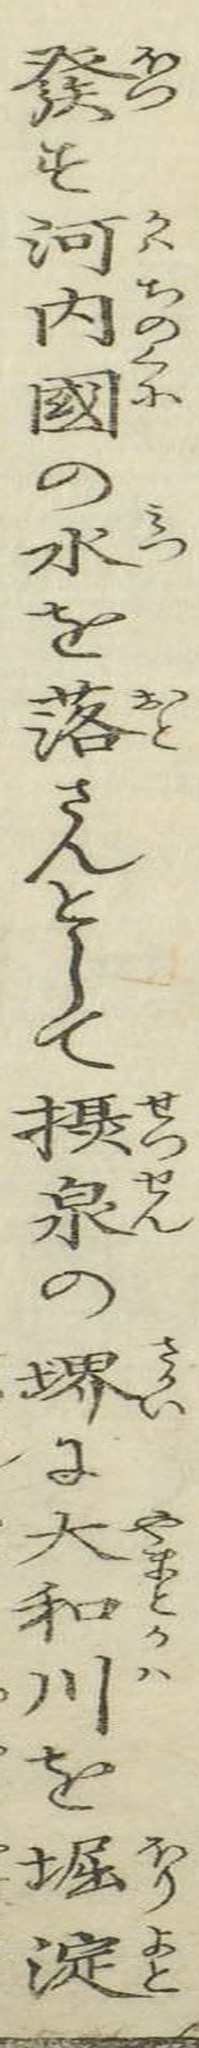發す河内國の水を落さんとして摂泉の堺に大和川を堀淀
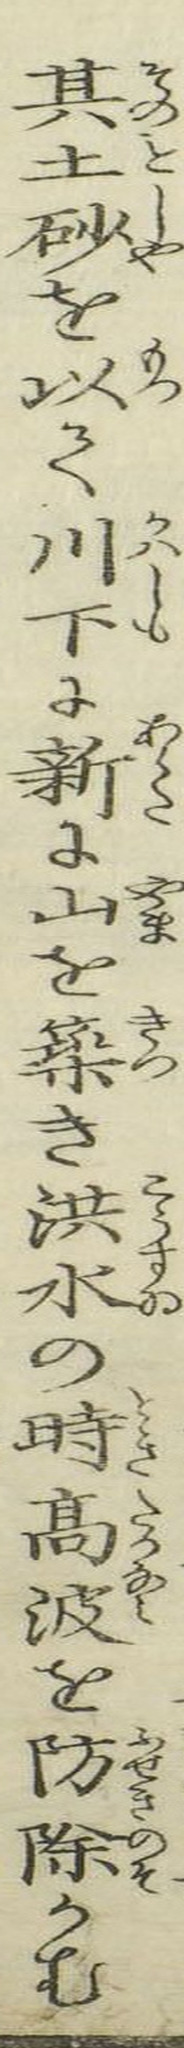其土砂を以て川下に新に山を築き洪水の時高波を防除かむ

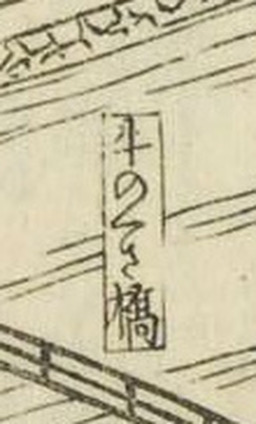牛のくさ橋
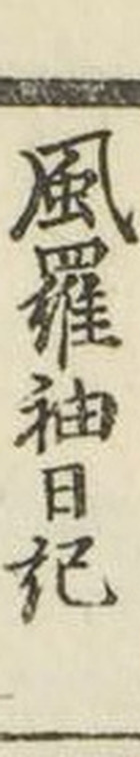風羅袖日記
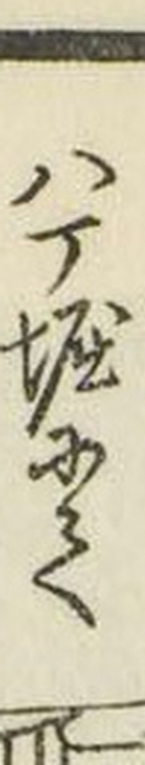八丁堀にて
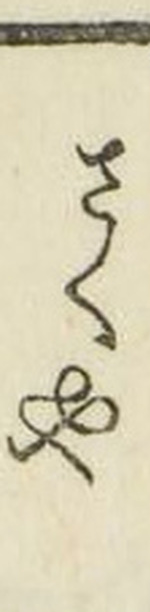さくや
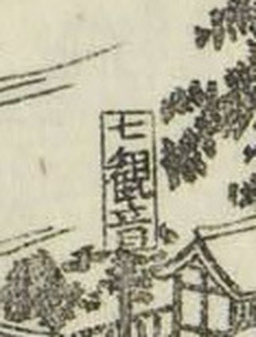七観音
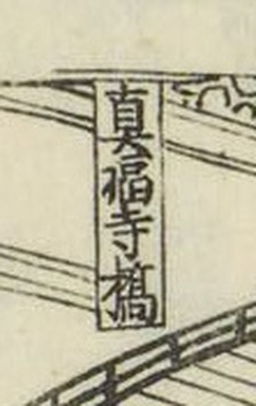真福寺橋

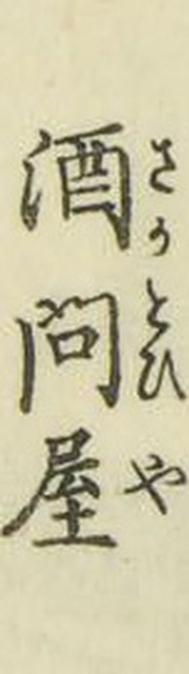酒問屋
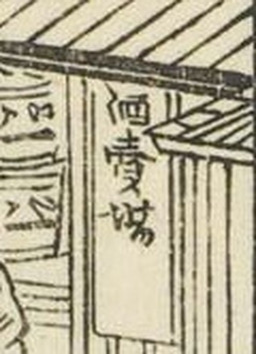酒賣場

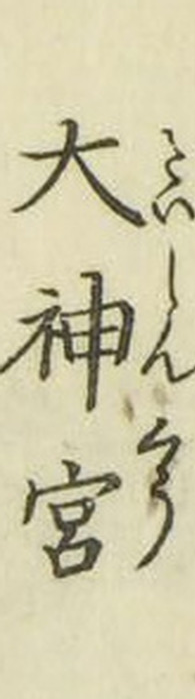大神宮

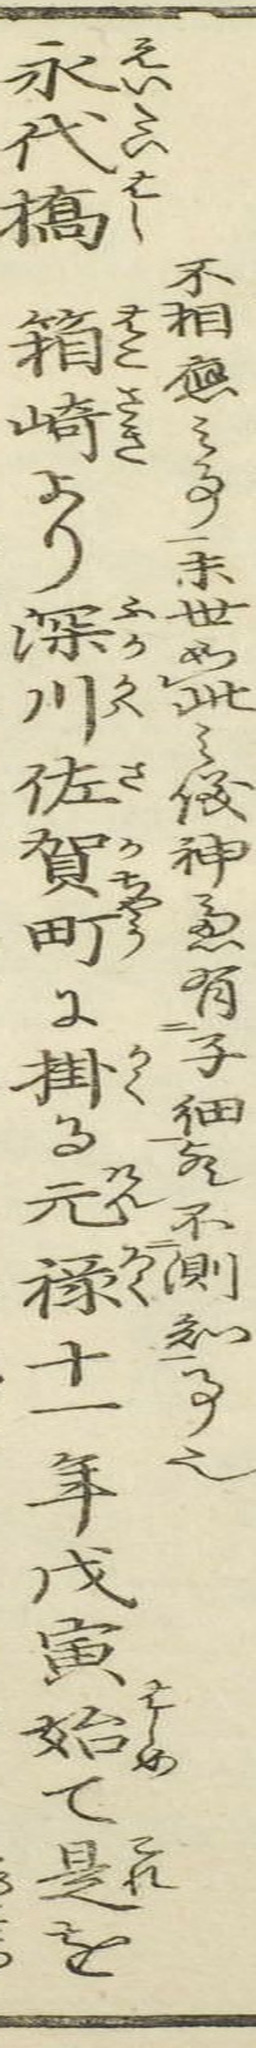永代橋箱崎より深川佐賀町に掛る元禄十一年戊寅始て是を
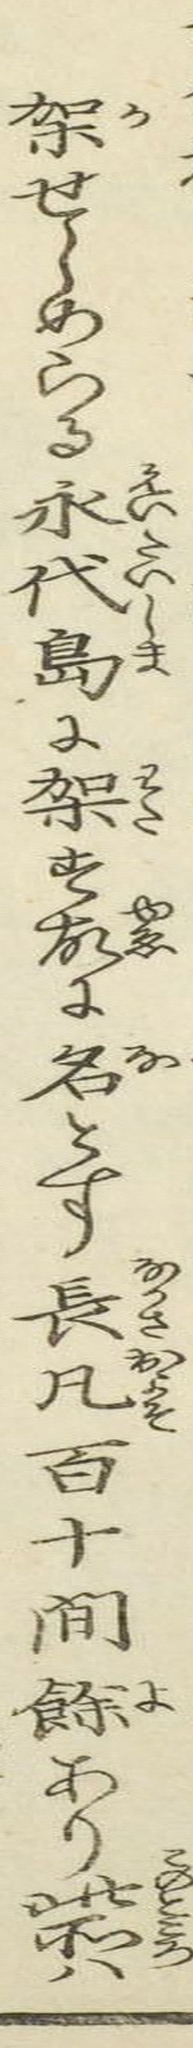架せしめらる永代島に架す故に名とす長凡百十間餘あり此所は
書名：江戸名所図会 20巻 巻之2
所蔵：東京学芸大学教育コンテンツアーカイブ
